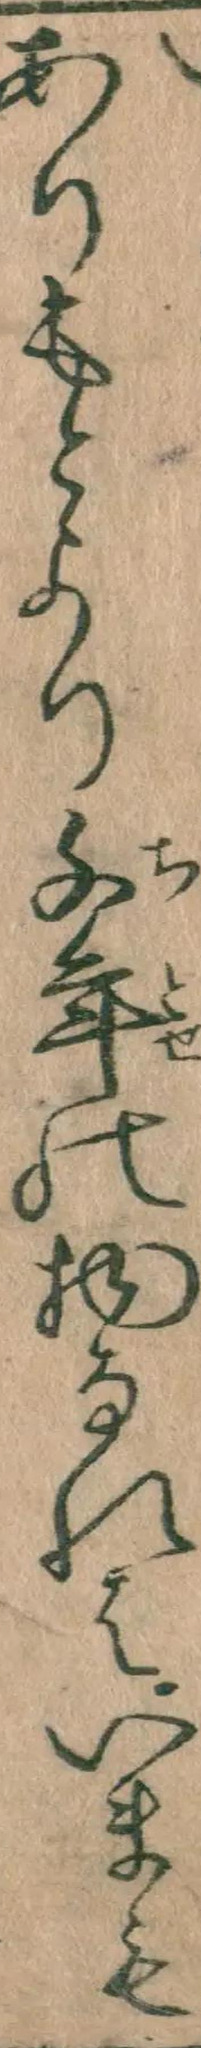ありもとより千年の物なれは、いまも
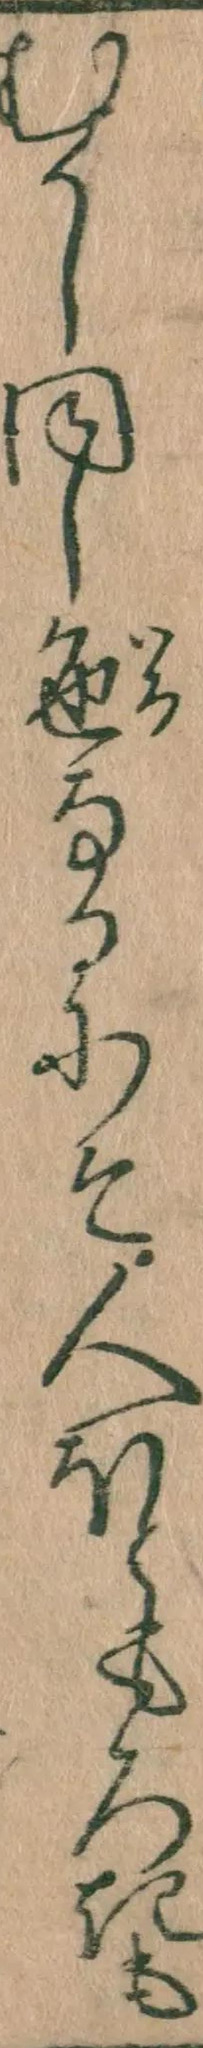むかし同し色なるにそ、人ほともろきも
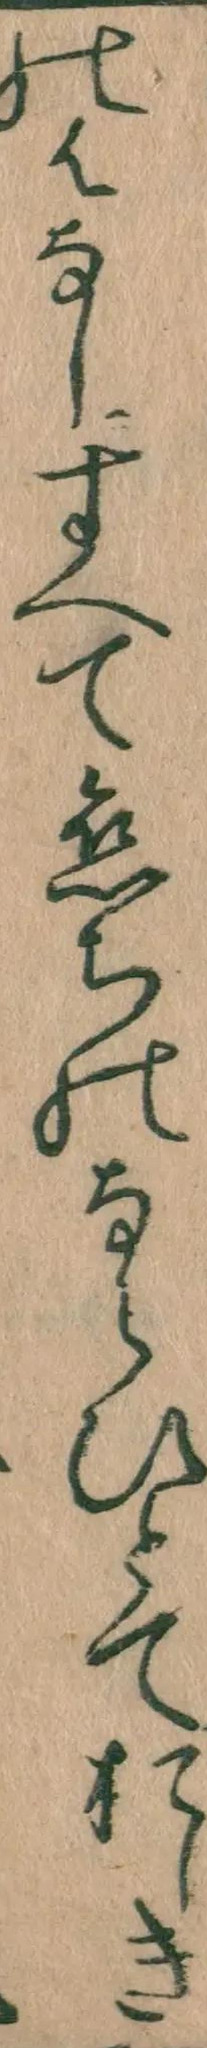のはなし。すへて恋ちのならひとて。おしき
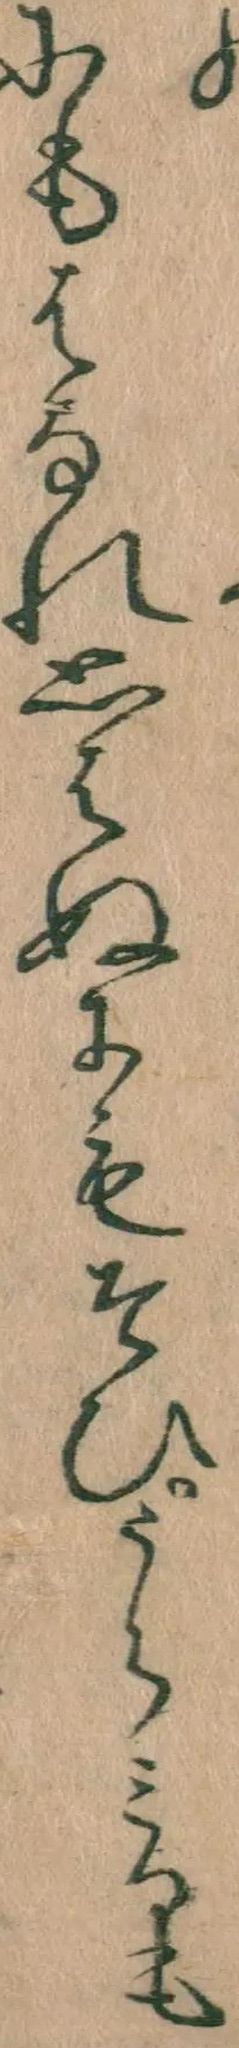にもはなれ思はぬにもそひ。うらみるも
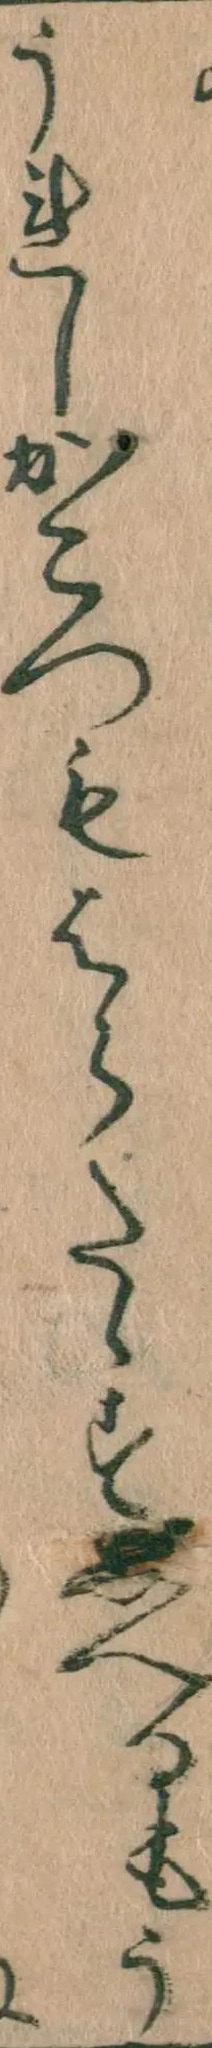うれしかこつもはらたゝす思へるもう
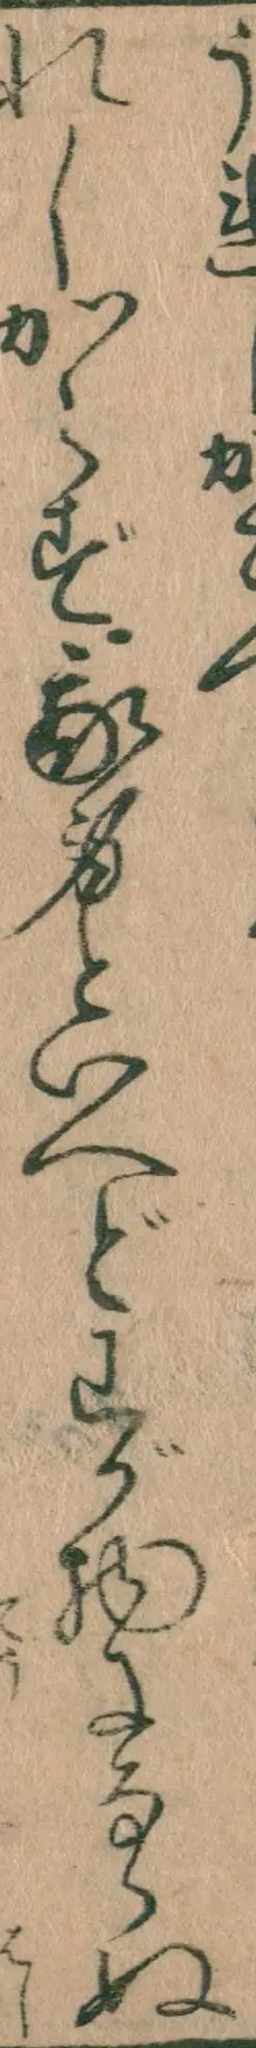れしからず、我身といへどわが物にならぬ
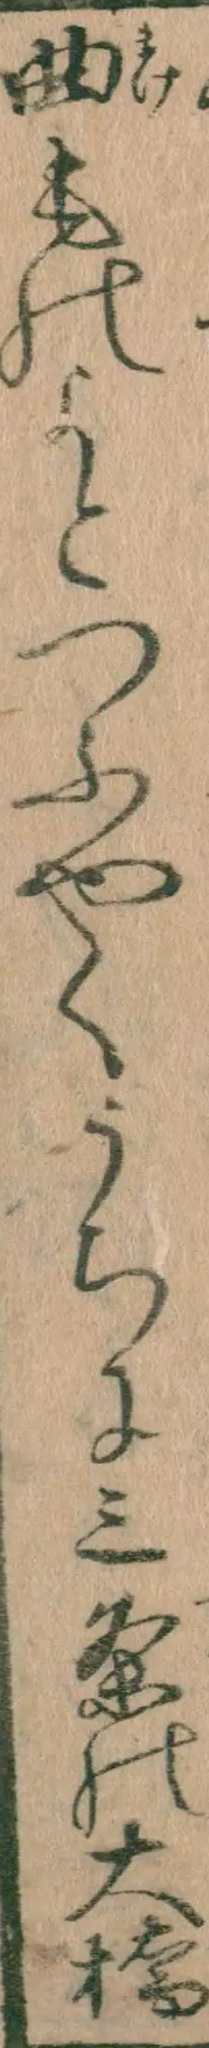曲ものよとつふやくうちに三条の大橋
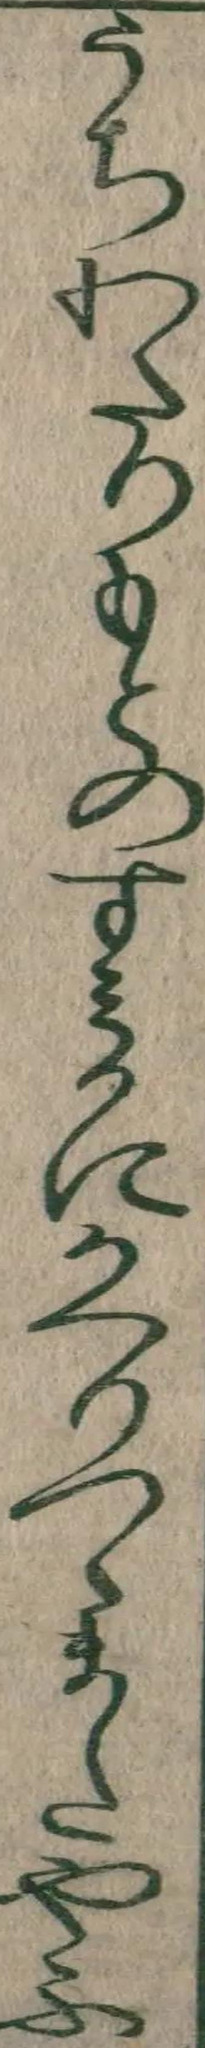うちわたりもとのすみかにかへりつゝまたやふ
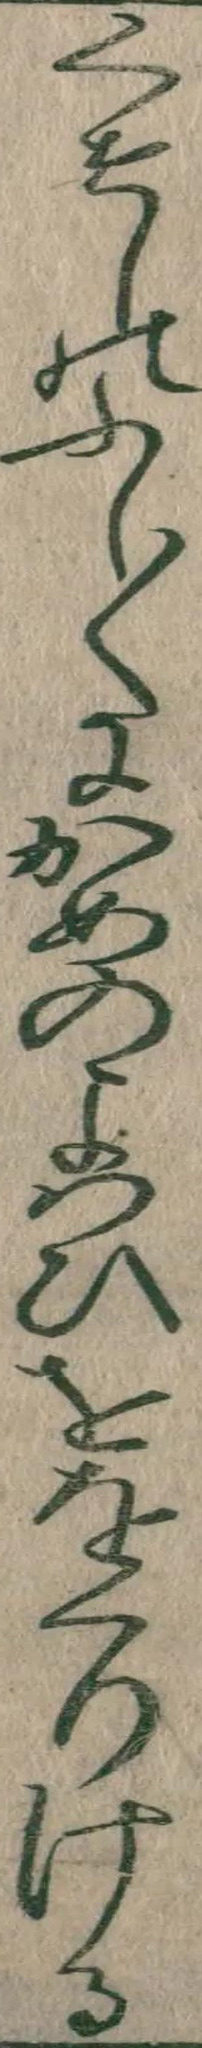くすしのふし〳〵にかめのよはひををくりける
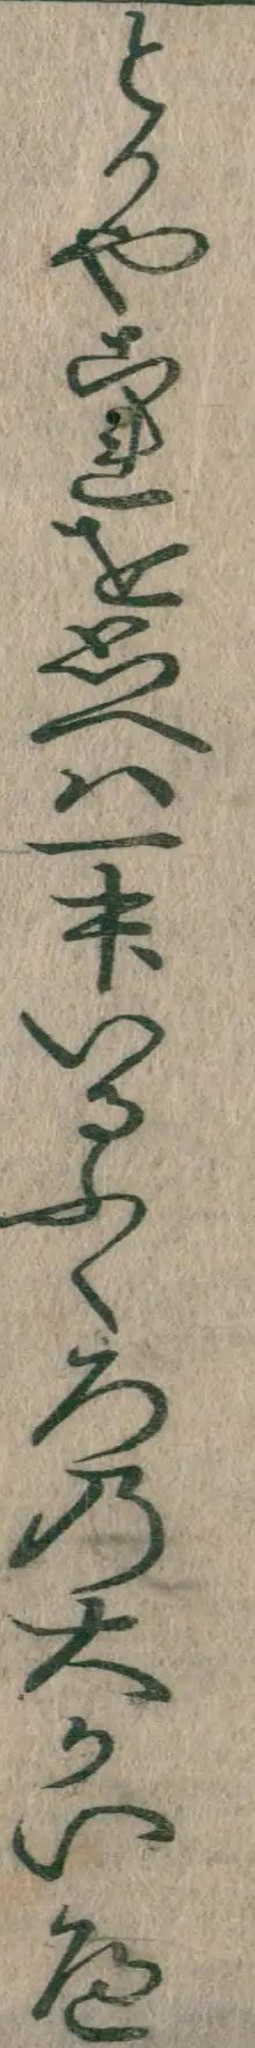とかやこれを思へは一升いるふくろの大かい道
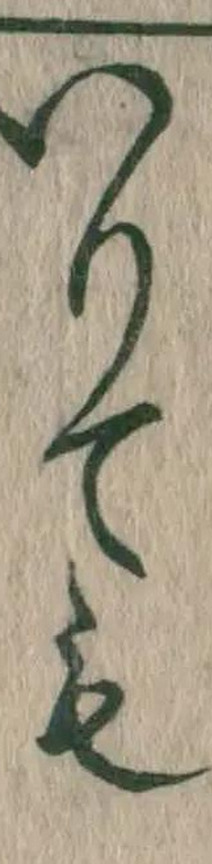いりても
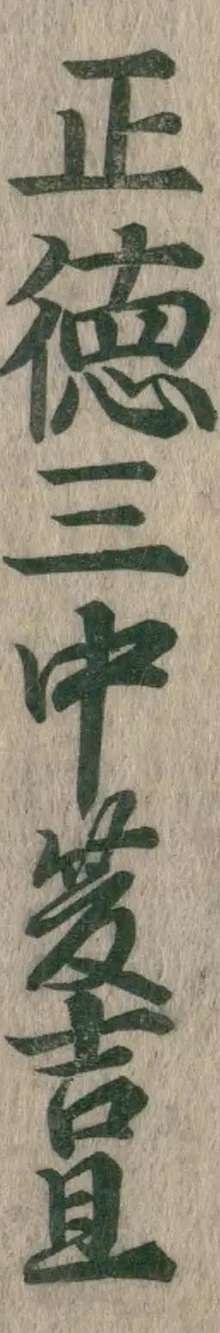正徳三中夏吉旦
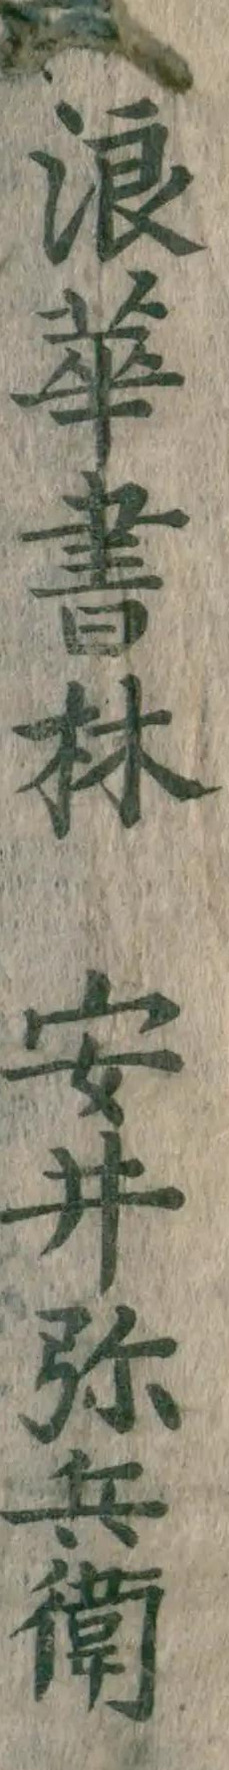浪華書林安井弥兵衛
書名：竹斎狂歌物語 3巻
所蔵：国立国会図書館 National Diet Library, JAPAN
